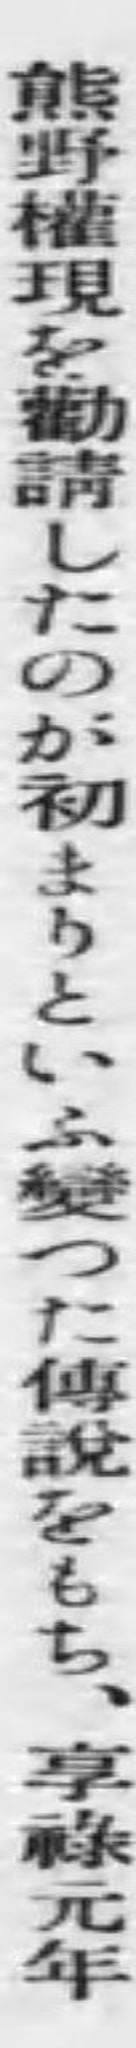熊野權現を勸請したのが初まりといふ變つた傳説をもち、享祿元年
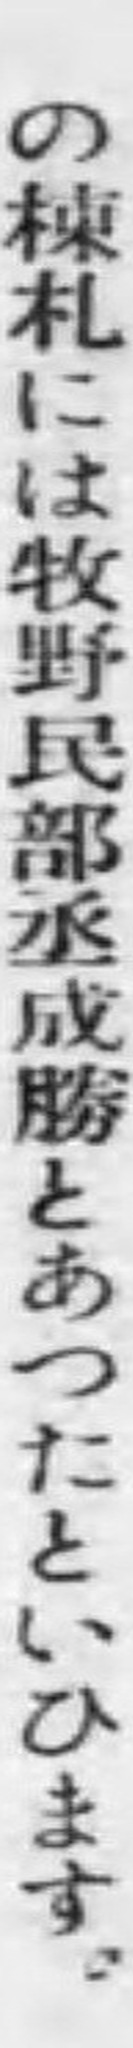の棟札には牧野民部丞成勝とあつたといひます。
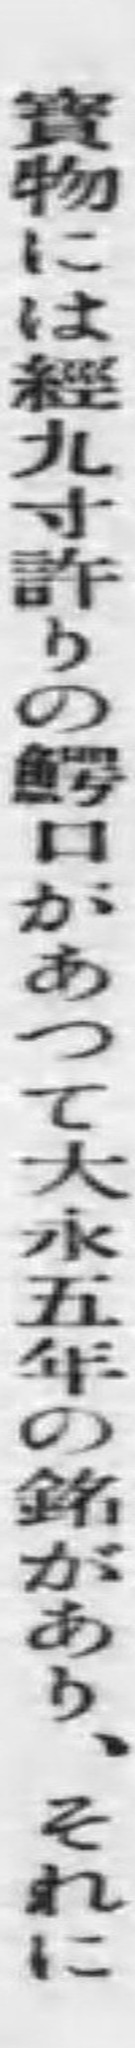寶物には經九寸許りの鰐口があつて大永五年の銘があり、それに
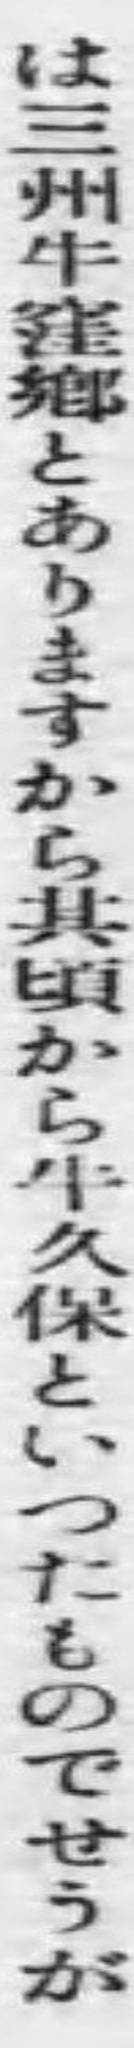は三州牛窪郷とありますから其頃から牛久保といつたものでせうが
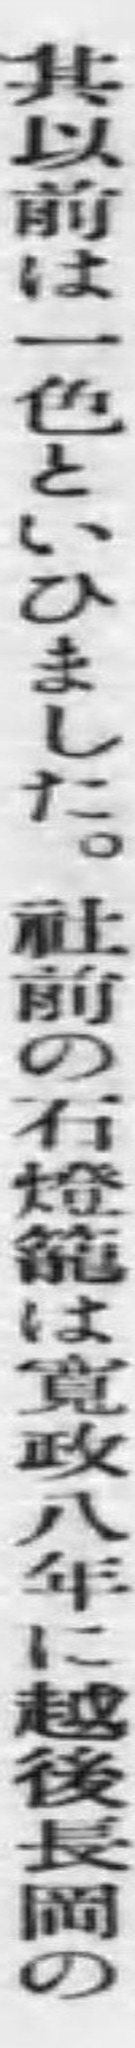其以前は一色といひました。社前の石燈籠は寛政八年に越後長岡の
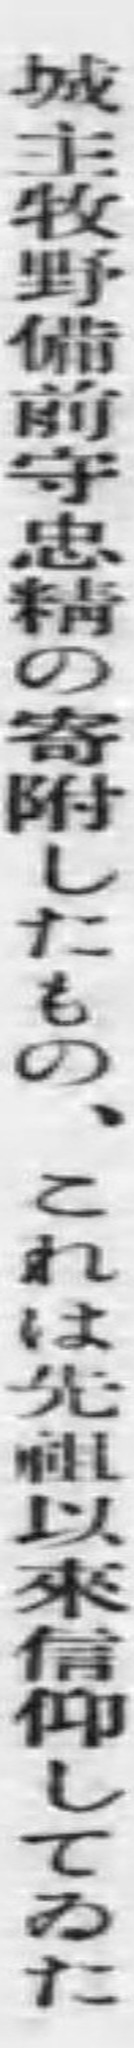城主牧野備前守忠精の寄附したもの、これは先祖以來信仰してゐた

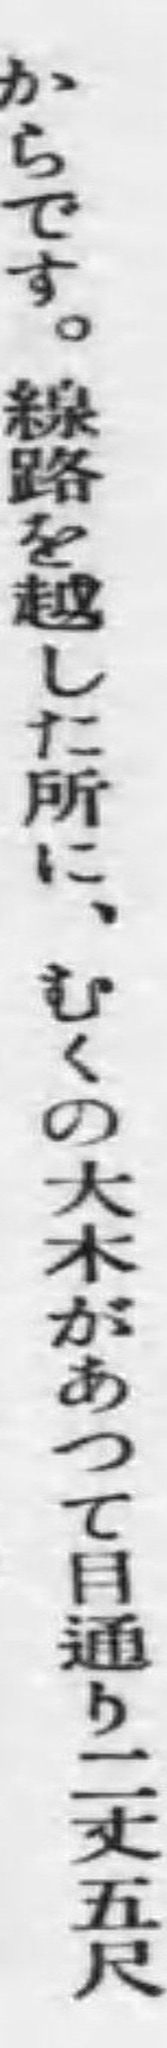からです。線路を越した所に、むくの大木があつて目通り二丈五尺
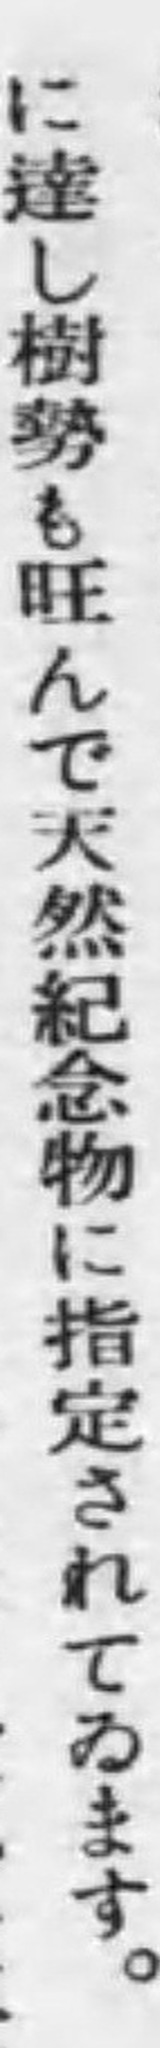に達し樹勢も旺んで天然紀念物に指定されてゐます。
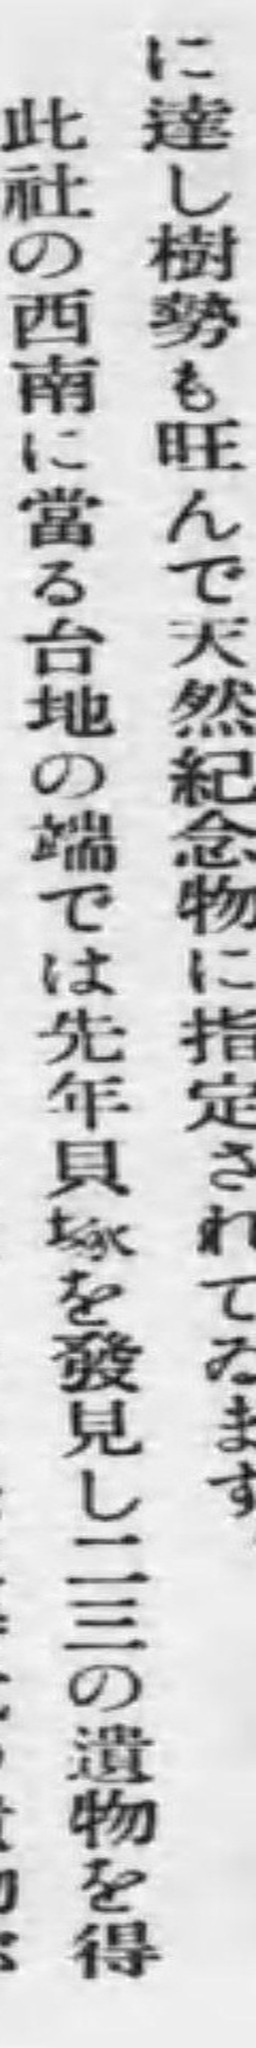此社の西南に當る台地の端では先年貝塚を發見し二三の遺物を得
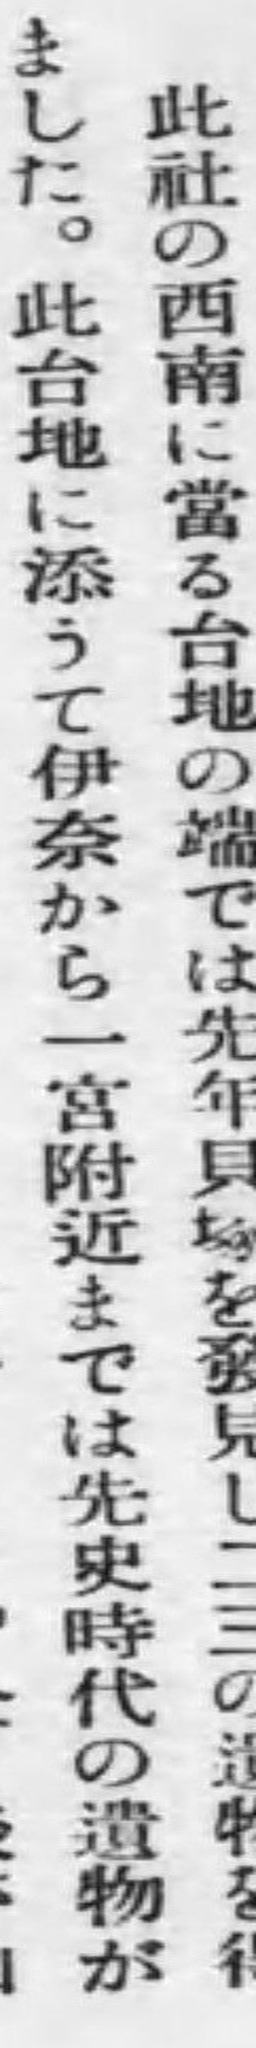ました。此台地に添うて伊奈から一宮附近までは先史時代の遺物が
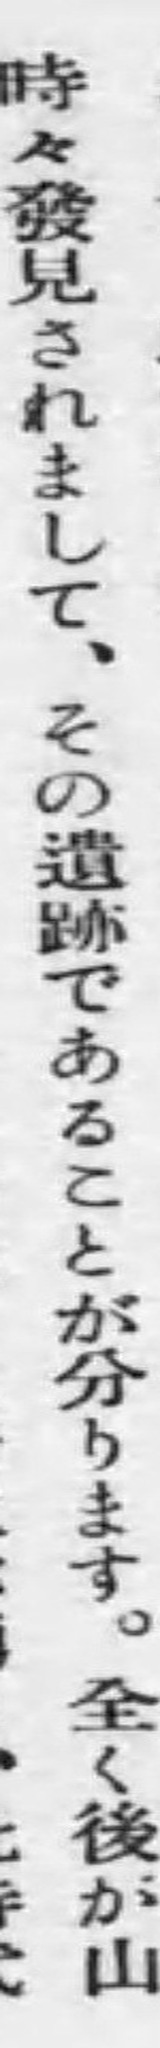時々發見されまして、その遺跡であることが分ります。全く後が山
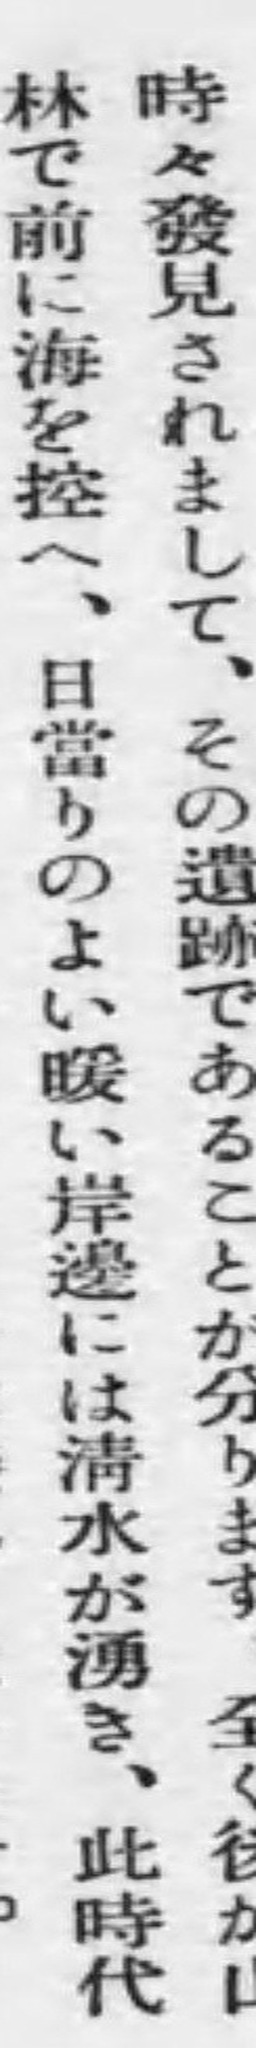林で前に海を控へ、日當りのよい暖い岸邊には清水が湧き、此時代
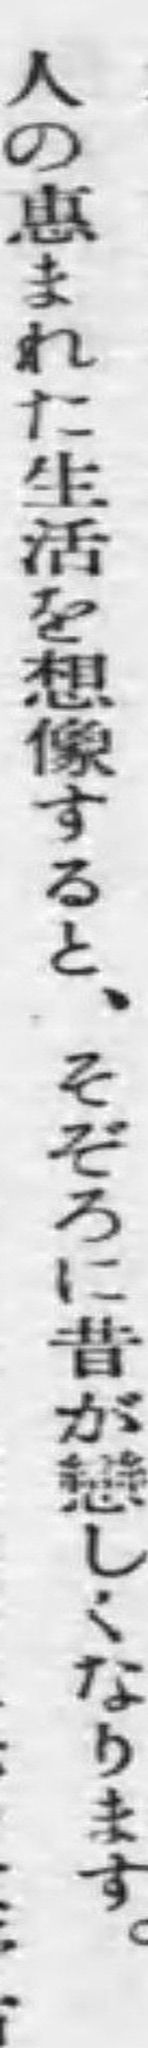人の惠まれた生活を想像すると、そぞろに昔が戀しくなります。
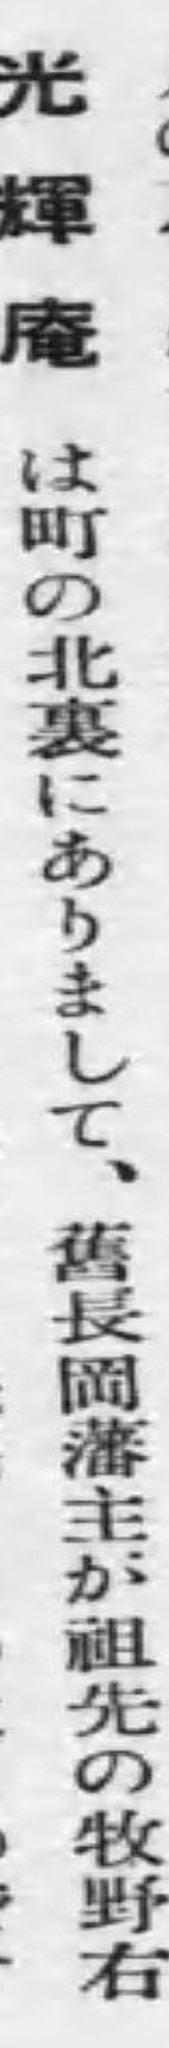光輝庵は町の北裏にありまして、舊長岡藩主が祖先の牧野右
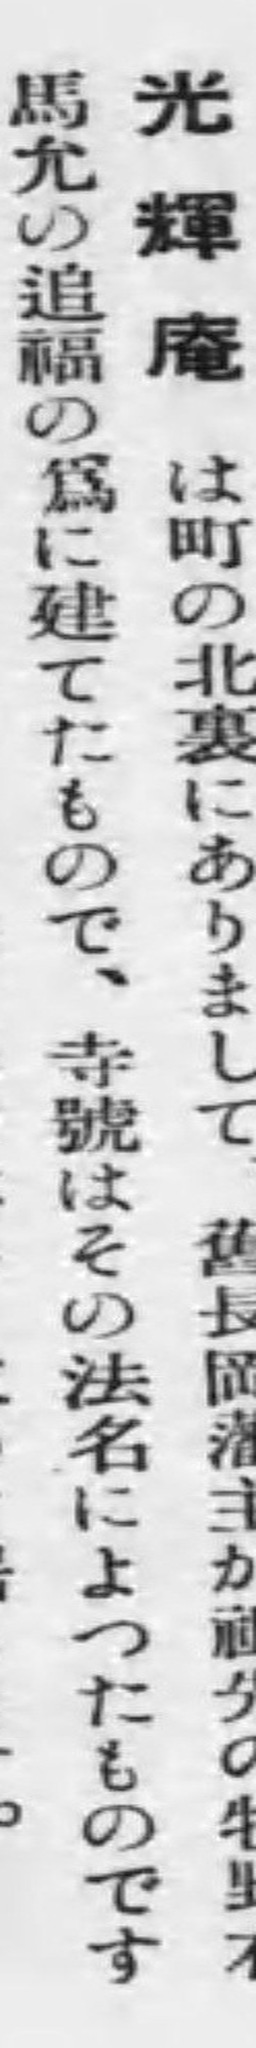馬允の追福の為に建てたもので、寺號はその法名によつたものです
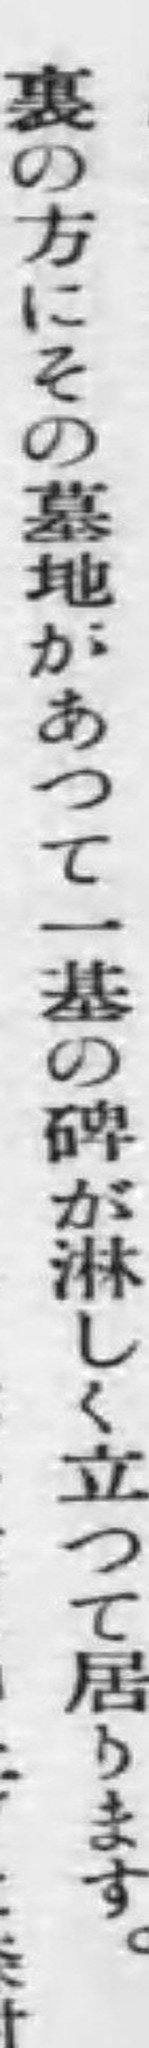裏の方にその墓地があつて一基の碑が淋しく立つて居ります。
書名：東三河道中記 : 豊橋市及其附近案内
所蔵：国立国会図書館 National Diet Library, JAPAN
